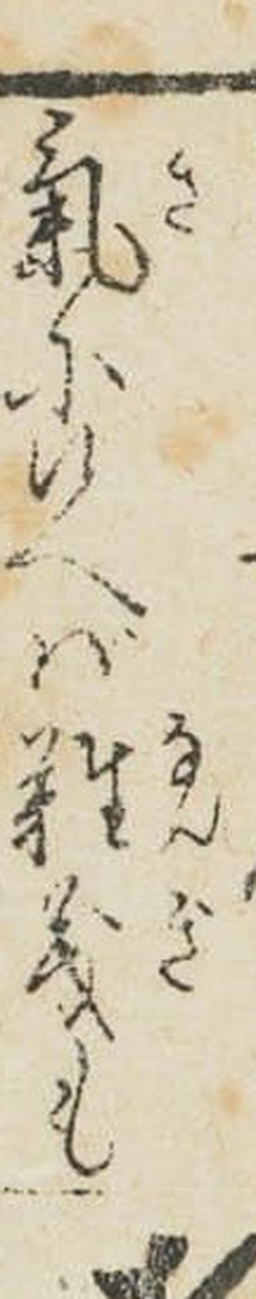気に候へば難義も
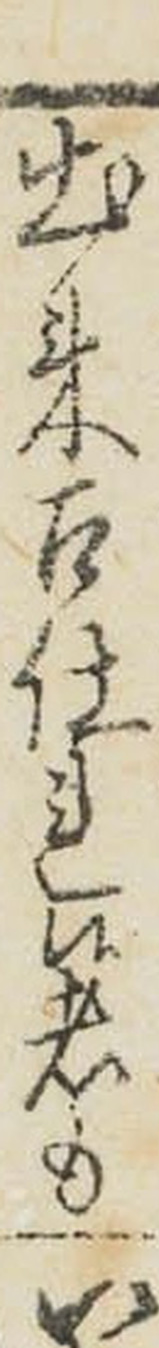出来召仕れ候者も
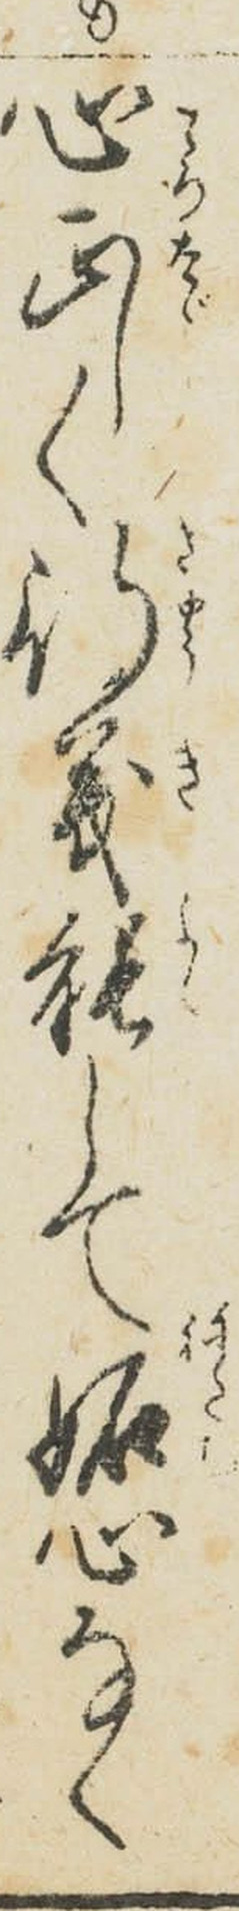心正しく行義能して妬心なく
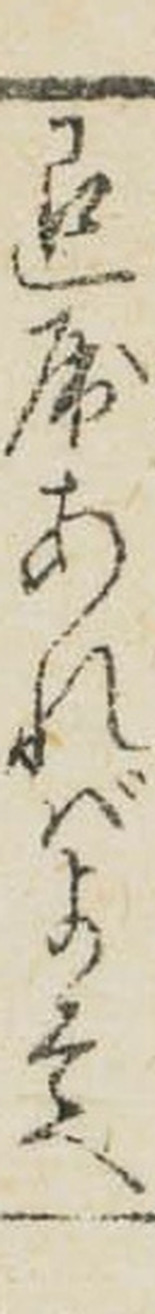退屈あればよそへ
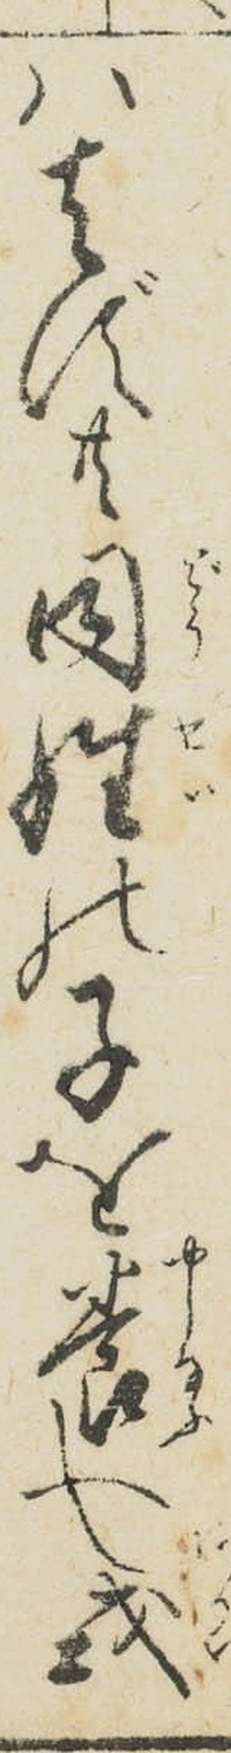は去ず共同姓の子を養へし或
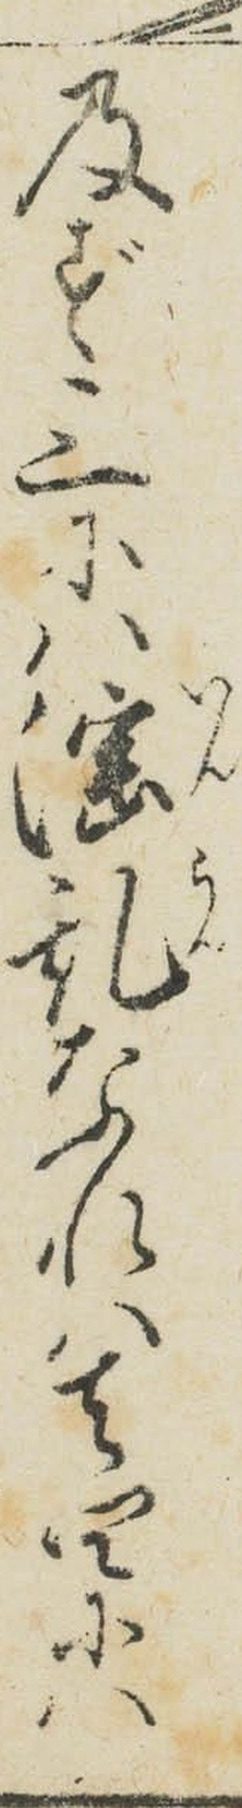及ず三には淫乱なれは去四には
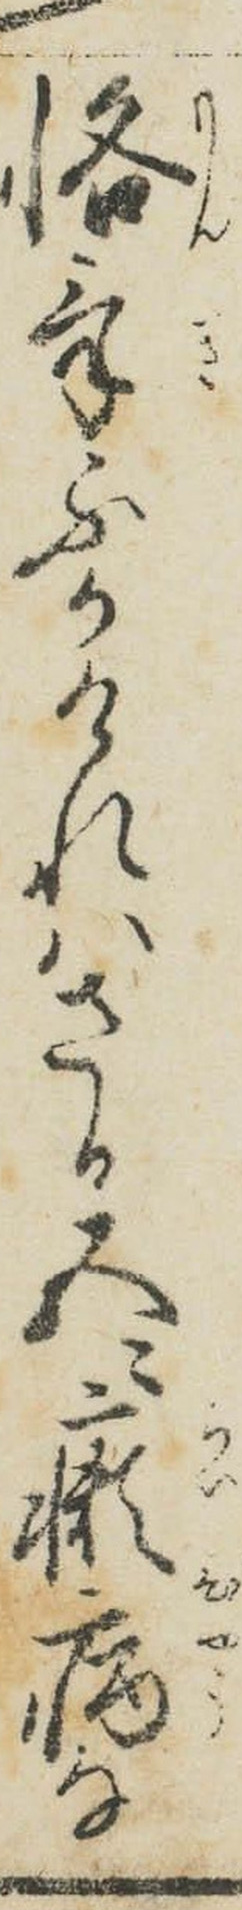悋気ふかけれはさる五癩病な
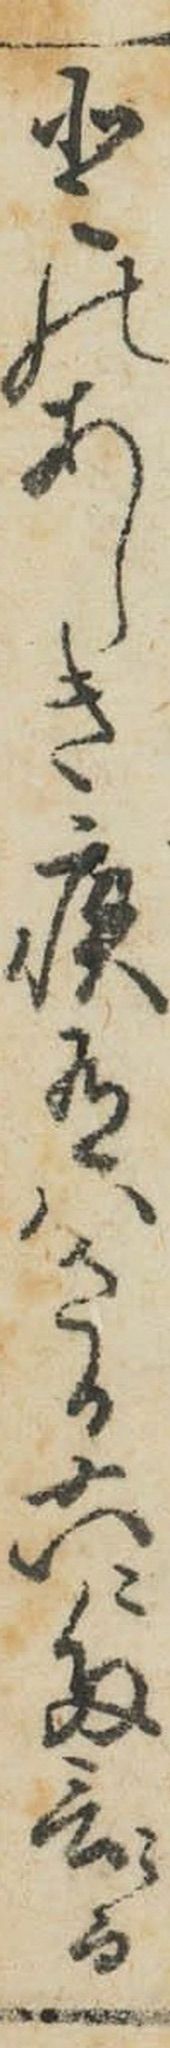とのあしき疾有はさる六多言而

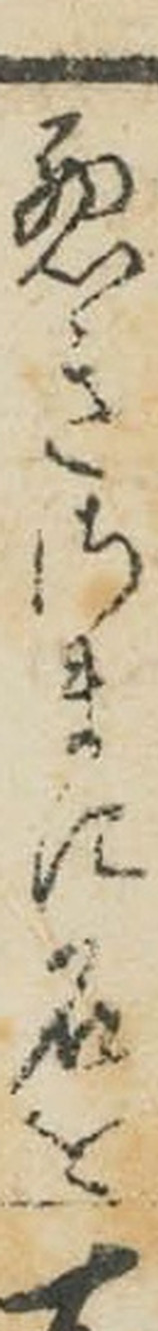悪きさまに名を
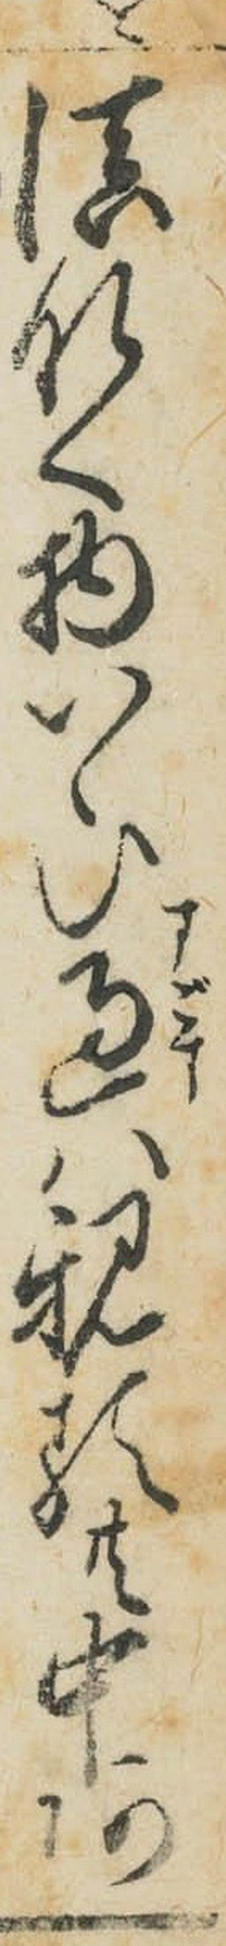慎なく物いひ過は親類共中あ
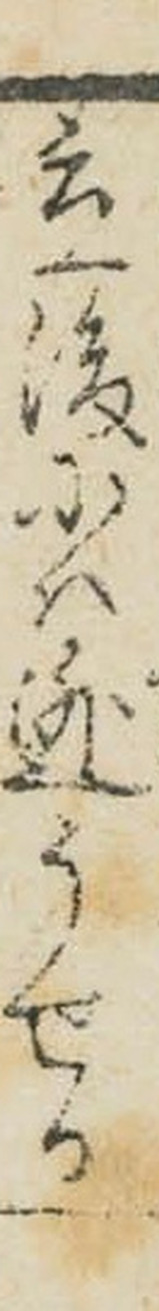立後に逃うせる
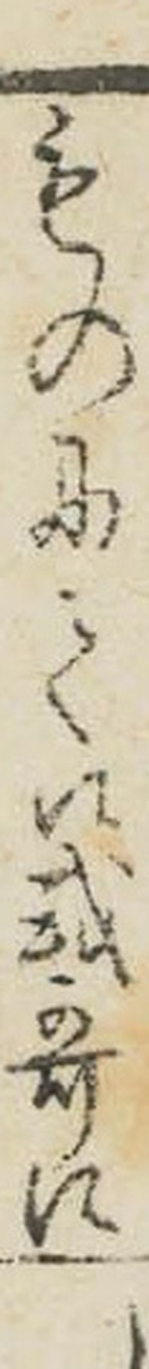ものにて候或哥に
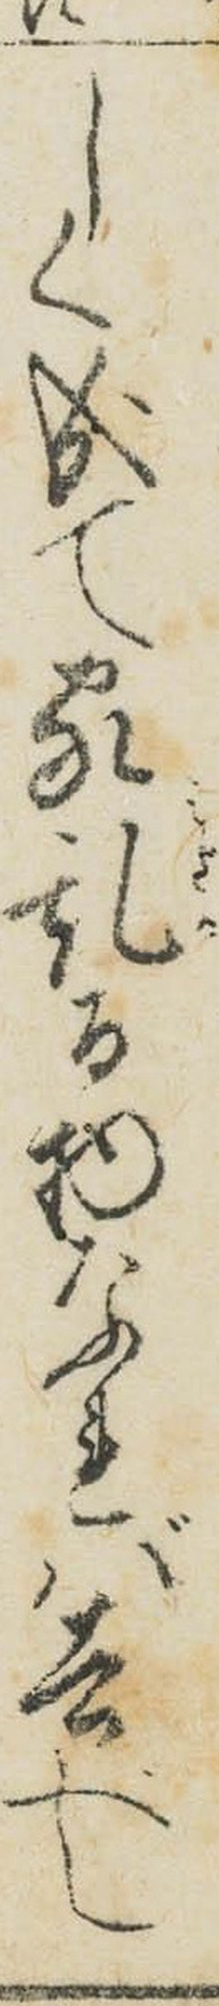しく成て家乱る物なれば去べし
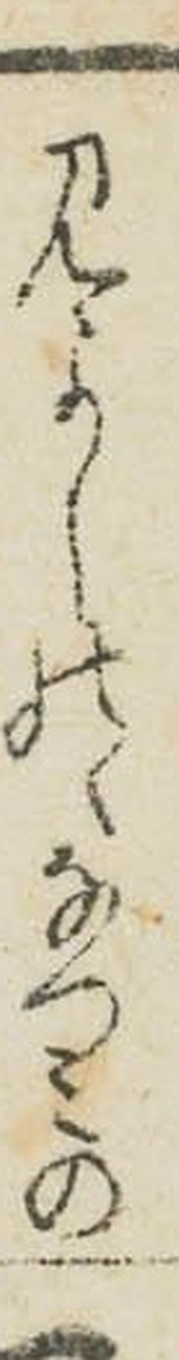みよしのゝなつみの
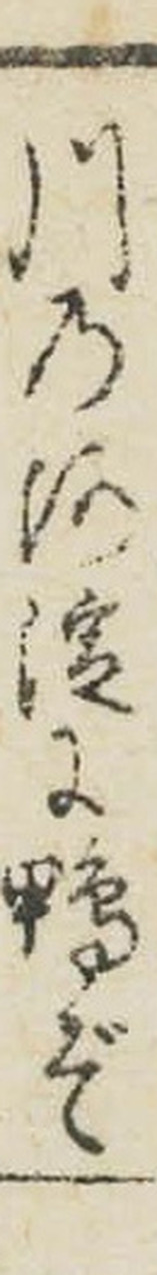川の河淀に鴨ぞ
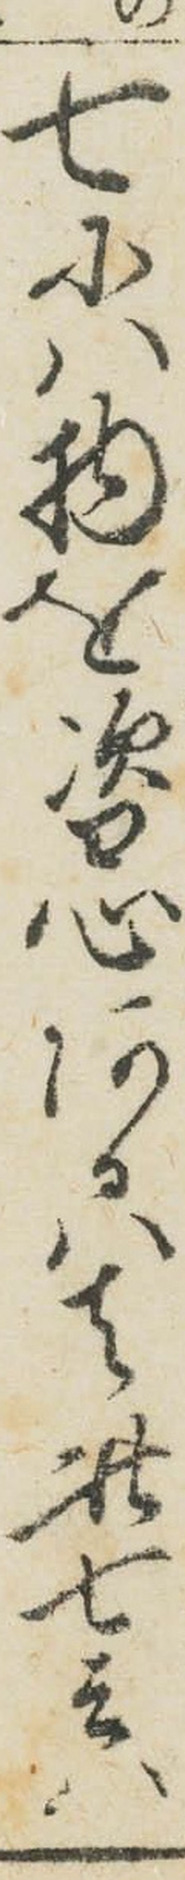七には物を盗心あるは去此七去は
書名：女大学
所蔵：東京学芸大学教育コンテンツアーカイブ
